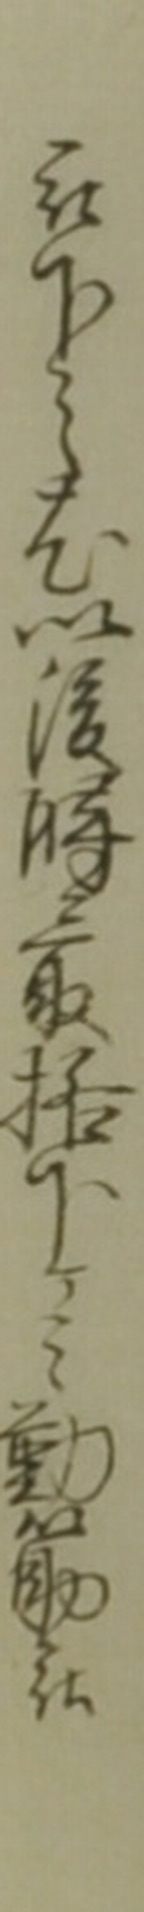被下之尤以後時ニ取格下之勤筋被
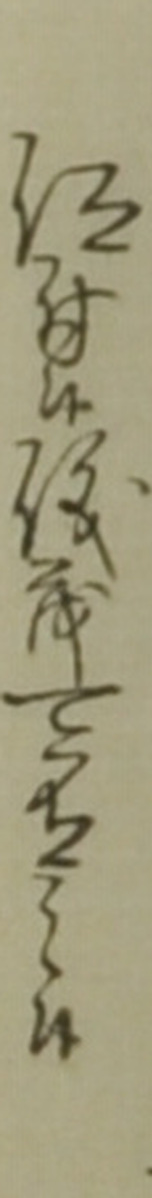仰付候儀茂可有之候

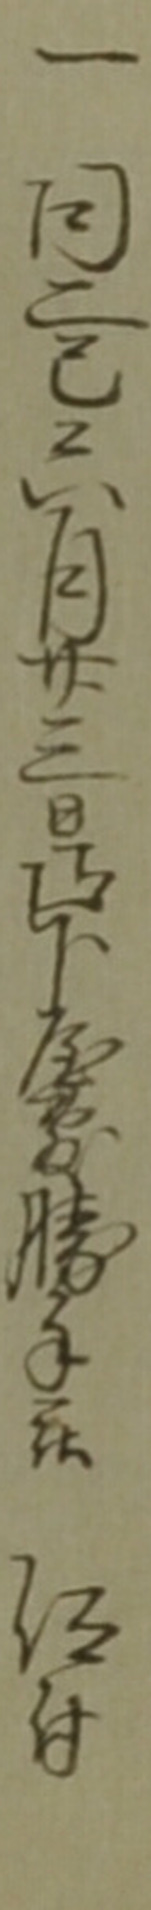一同二巳六月廿三日御下屋敷勝手被仰付
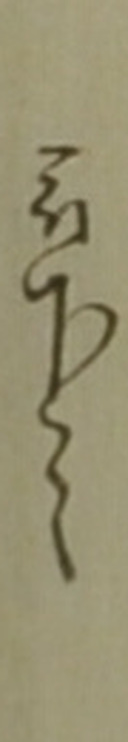被下之
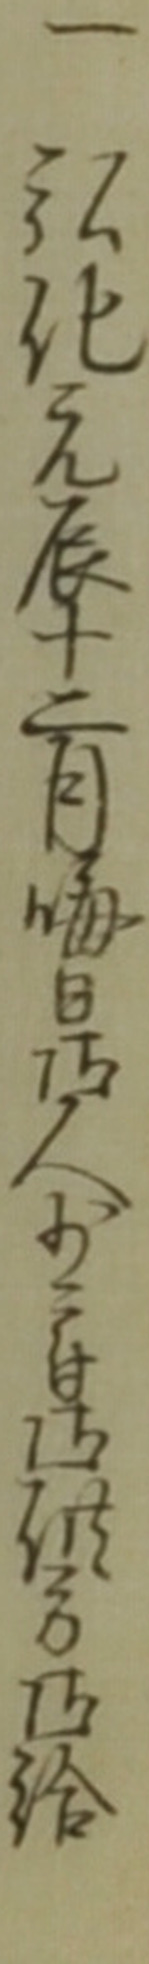一弘化元辰十二月晦日御人少ニ付御供方御給
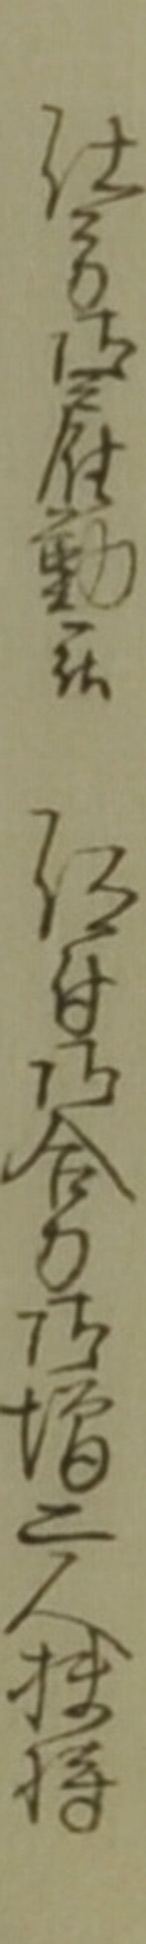仕方御雇勤被仰付御合力御増二人扶持
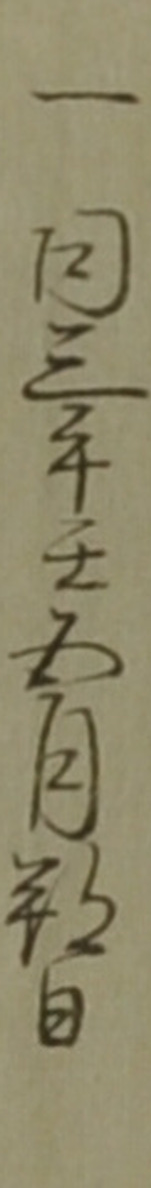一同三午閏五月朔日
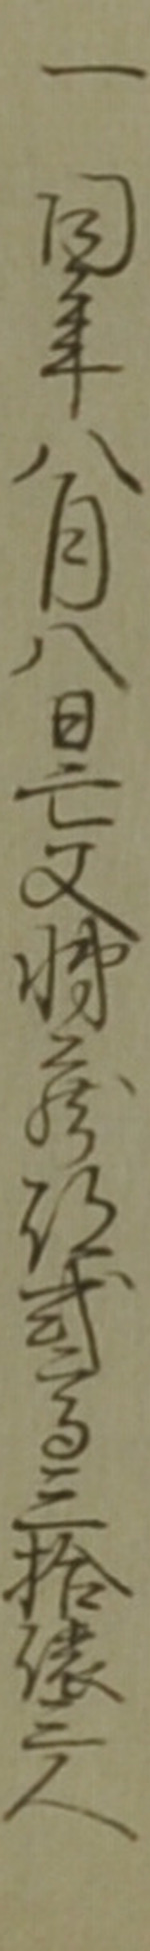一同年八月八日亡父悌蔵跡式高三拾俵二人
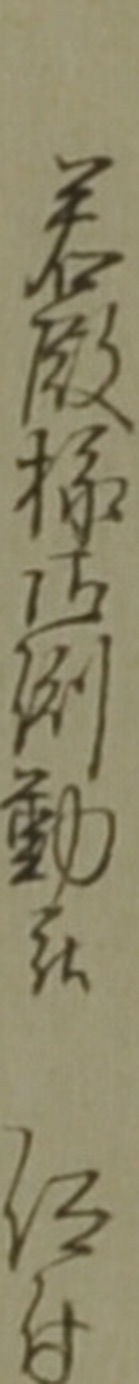若殿様御側勤被仰付
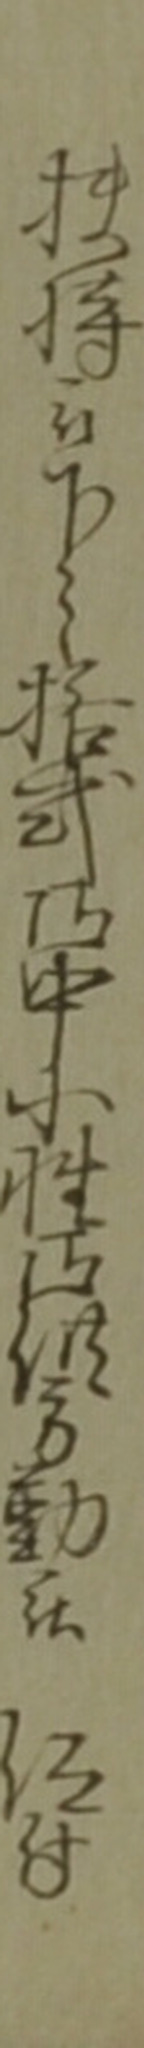扶持被下之格式御中小性御供方勤被仰付
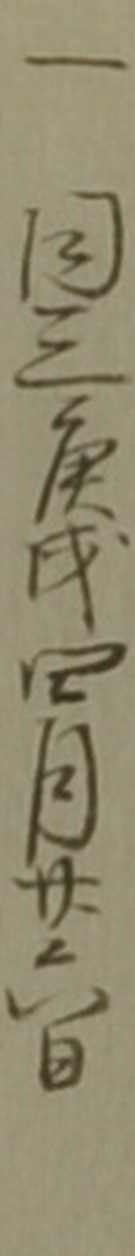一同三庚戌四月廿六日
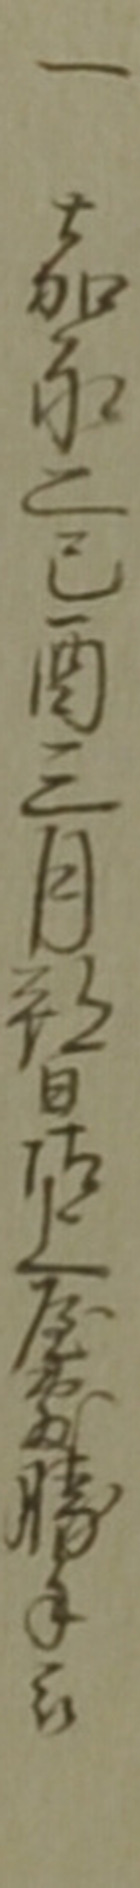一嘉永二巳酉三月朔日御上屋敷勝手被
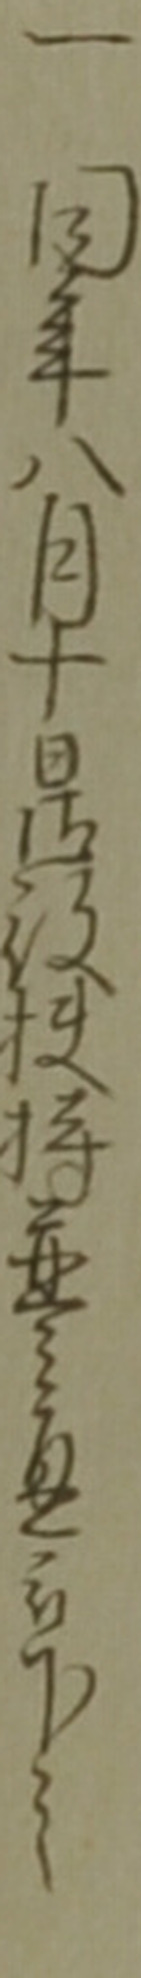一同年八月十日御役扶持並之通被下之
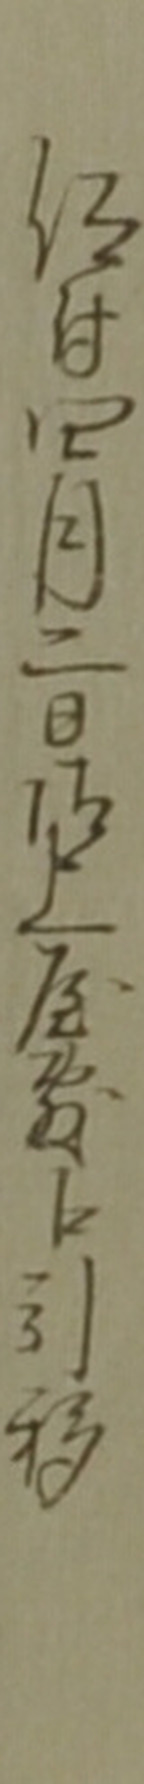仰付四月二日御上屋敷江被引移
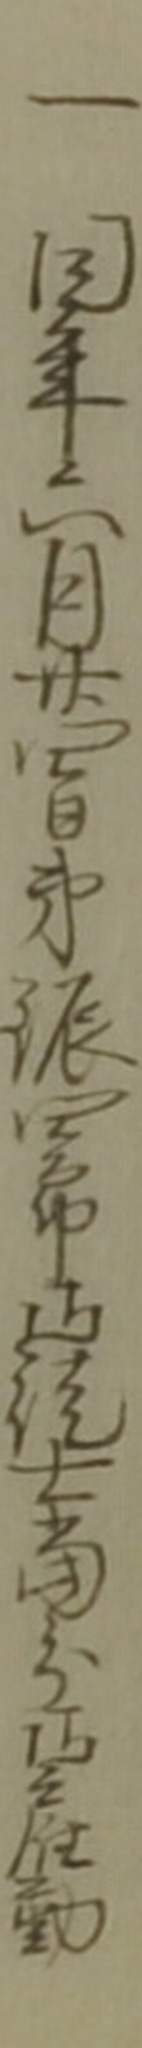一同年六月廿四日弟鋠四郎御徒士当分御雇勤
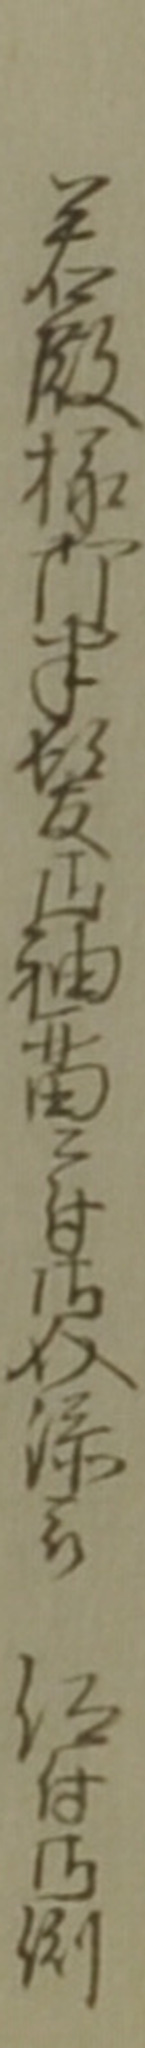若殿様御半髪御袖留ニ付御介添被仰付御側
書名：無足廃家（弐）
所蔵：伊那市立高遠町図書館・合同会社AMANE
